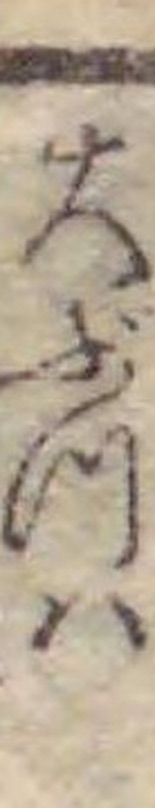大ぶつは
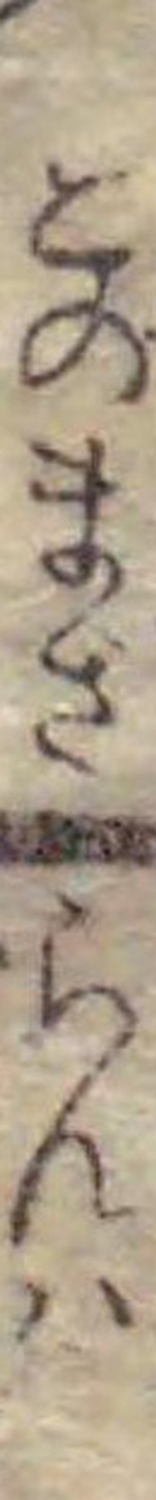このまさらんは
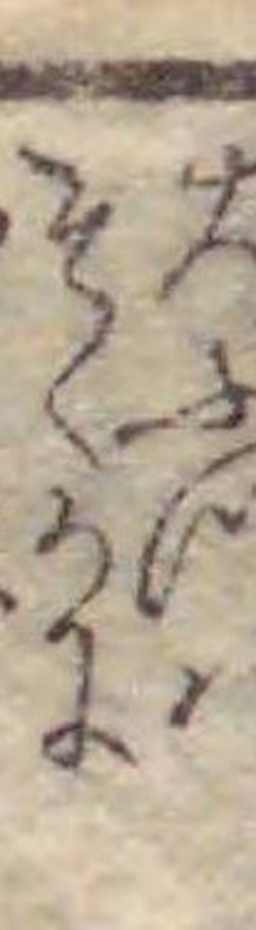そくかに
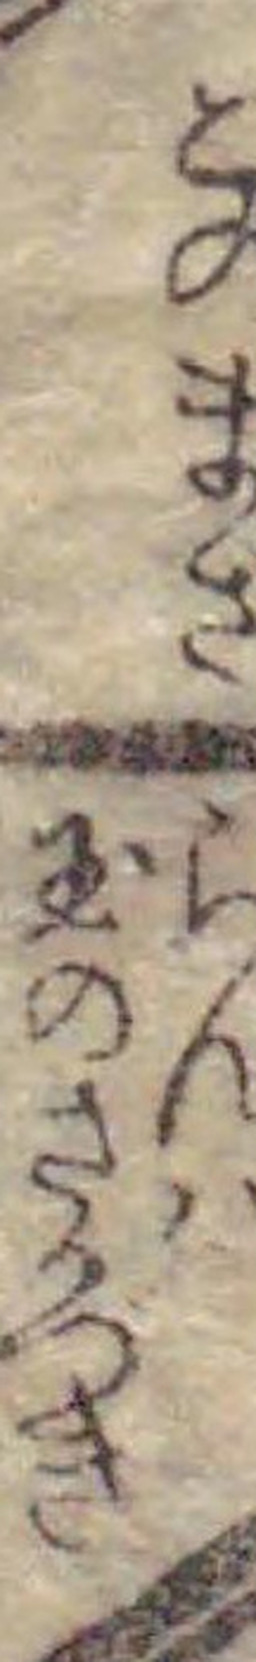玉のさかづき
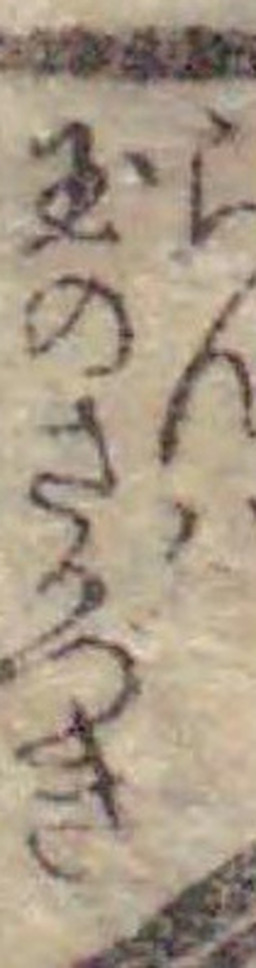玉のさかづき
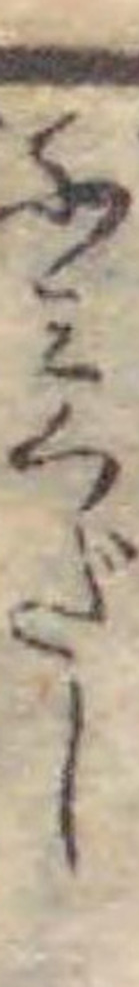ふみくだし
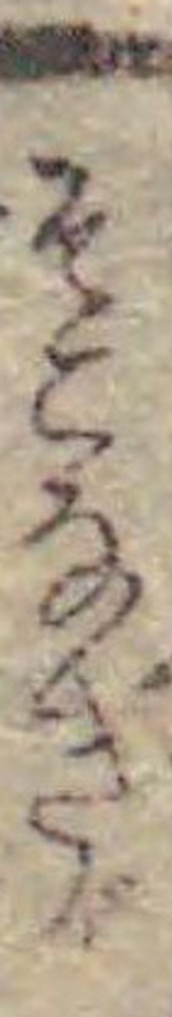そこなきが
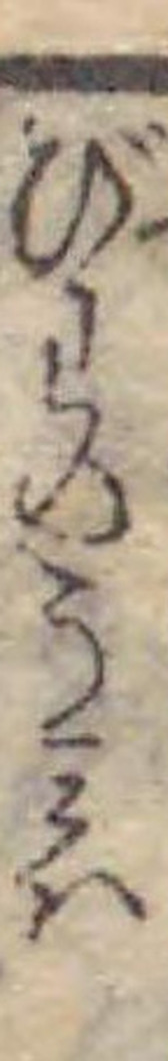びわのうみは
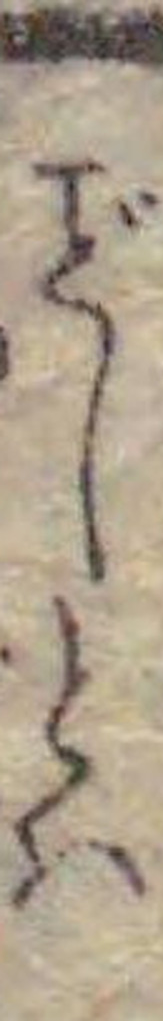ごとしとは
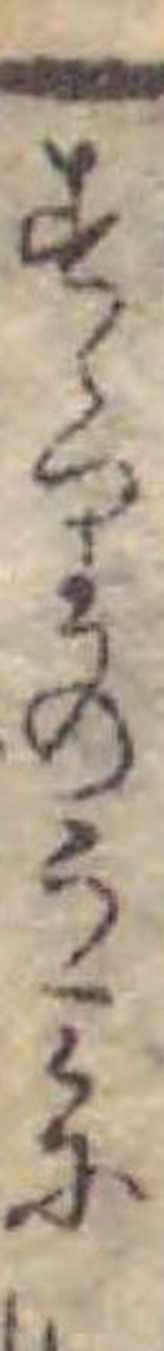すゝりのうみに
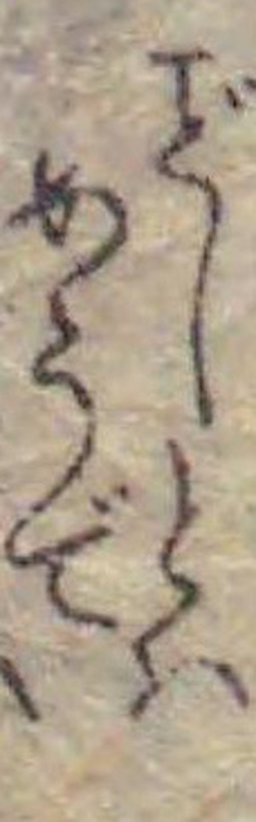めうで
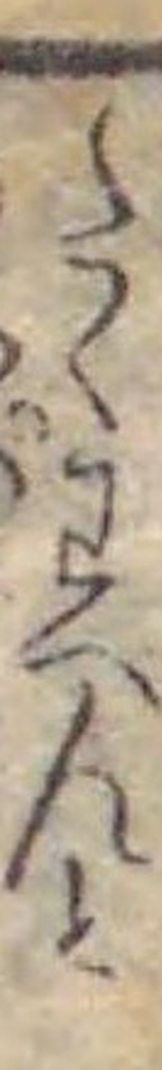たくわへんと
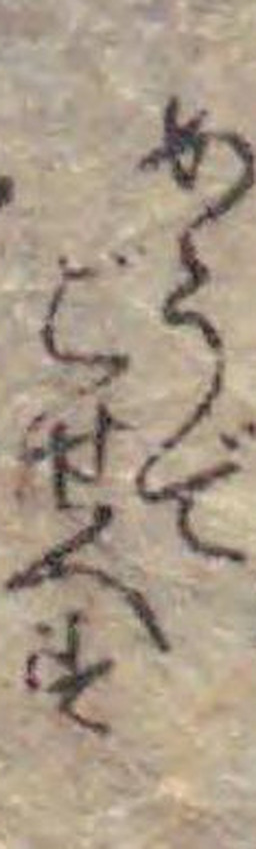ごせへす
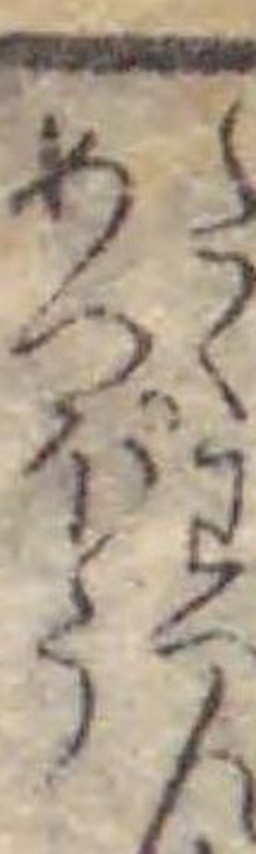めつぽう
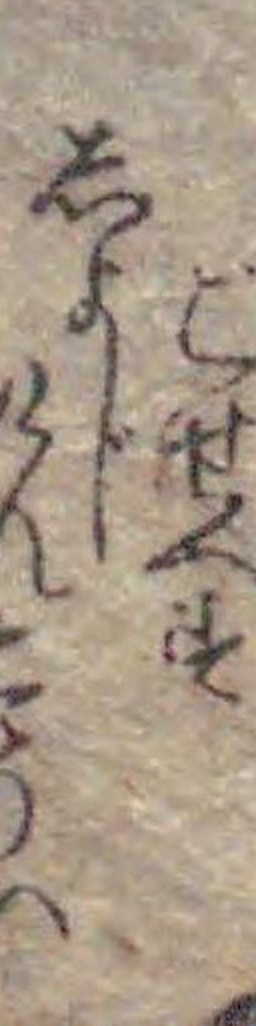しよじ
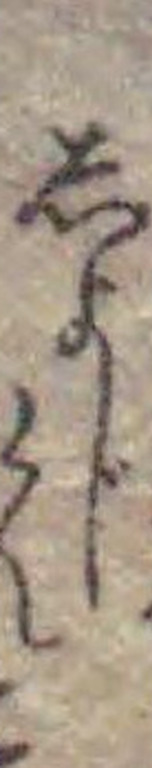しよじ
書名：人間一心覗替繰 : 2巻
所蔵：国立国会図書館 National Diet Library, JAPAN
